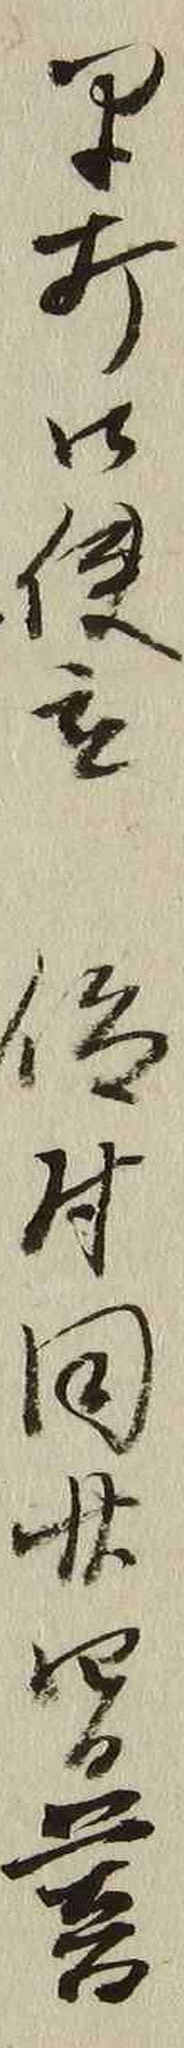早打御使被仰付同廿四日暮
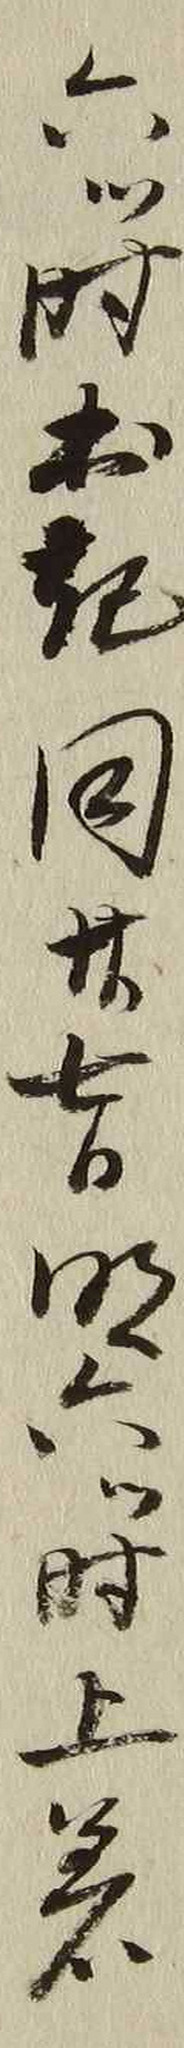六ツ時出起同廿七日明六ツ時上着
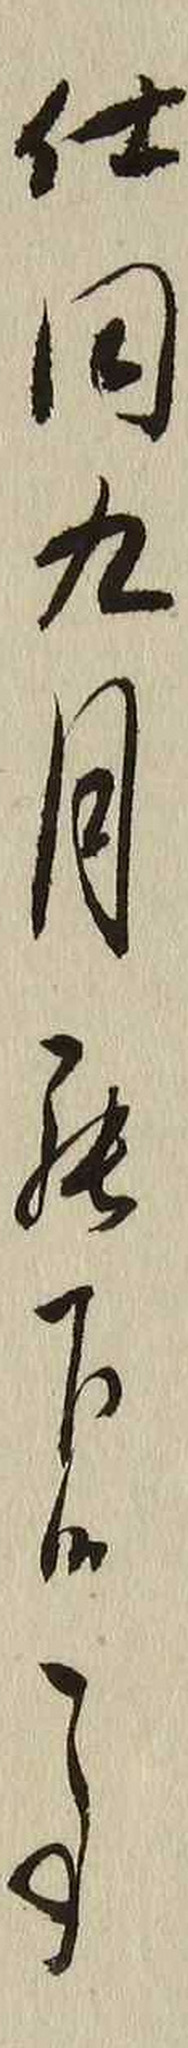仕同九月罷下候事
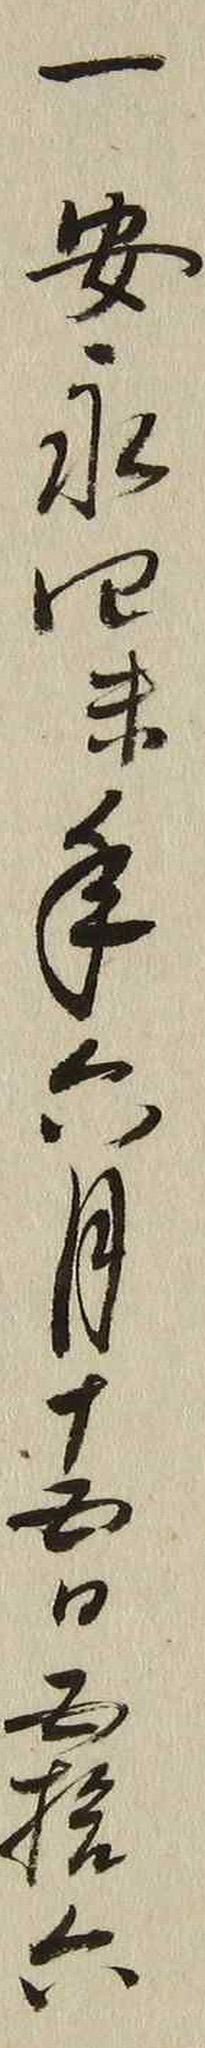一安永四未年六月十五日五拾六
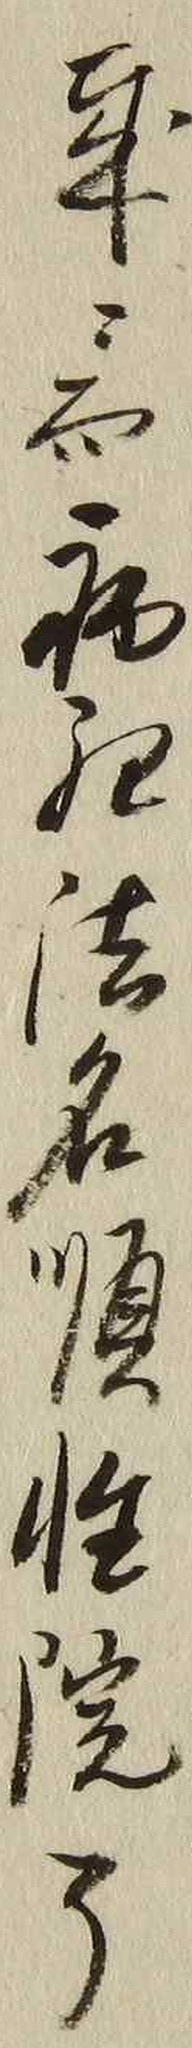歳ニ而病死法名順性院了
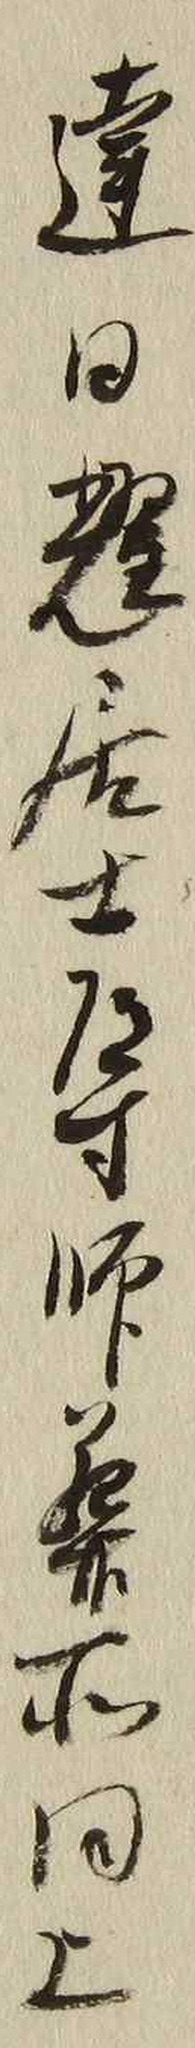達日耀居士導師葬所同上
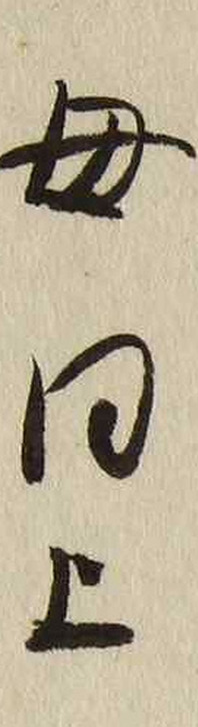母同上
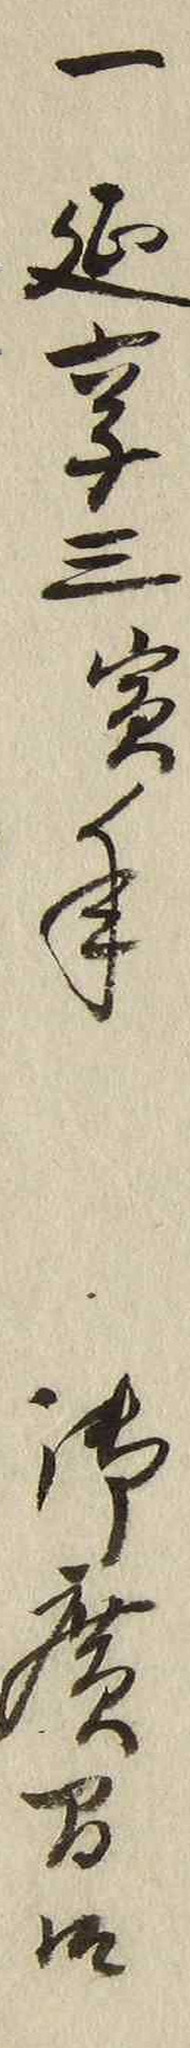一延享三寅年御広間御
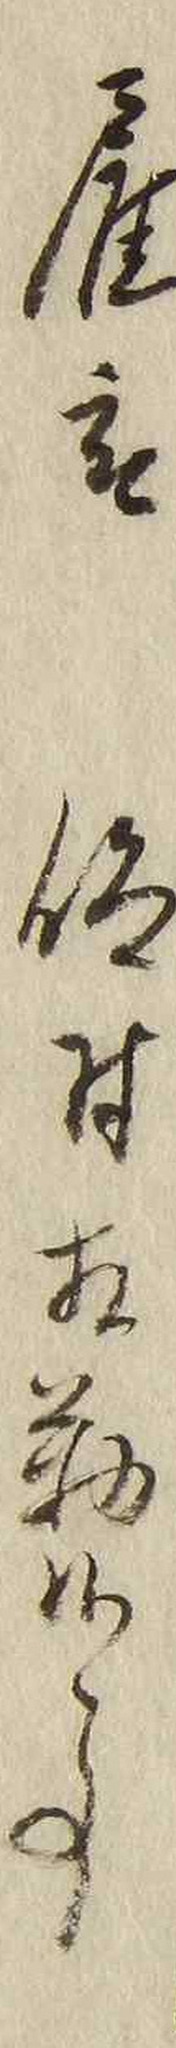雇被仰付相勤候事

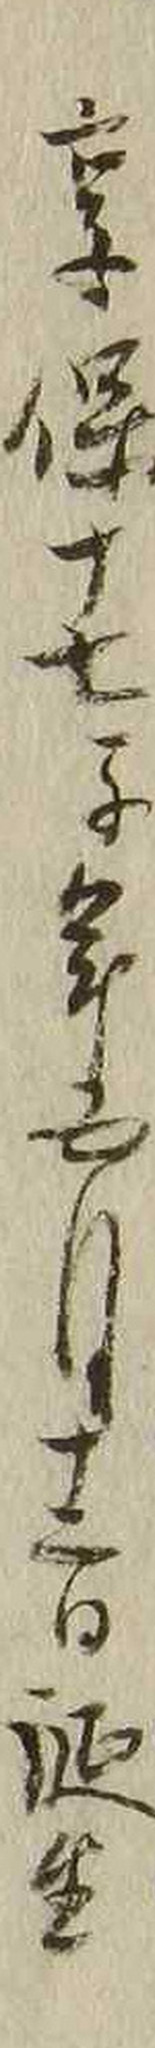享保十七子年五月十二日誕生
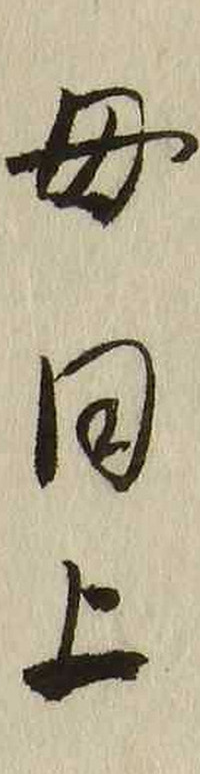母同上
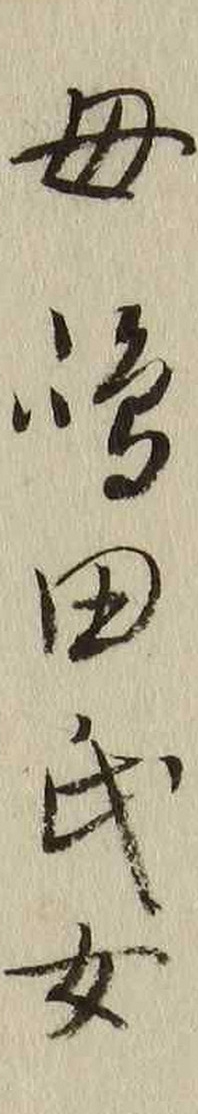母島田氏女
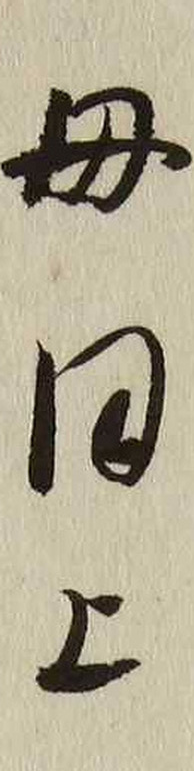母同上
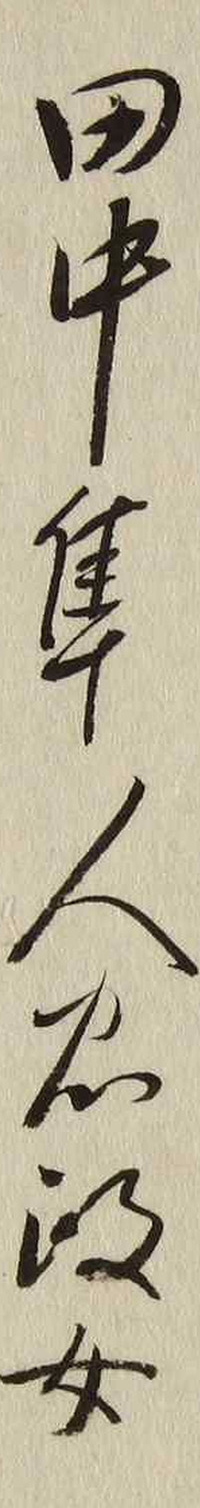田中隼人忠政女
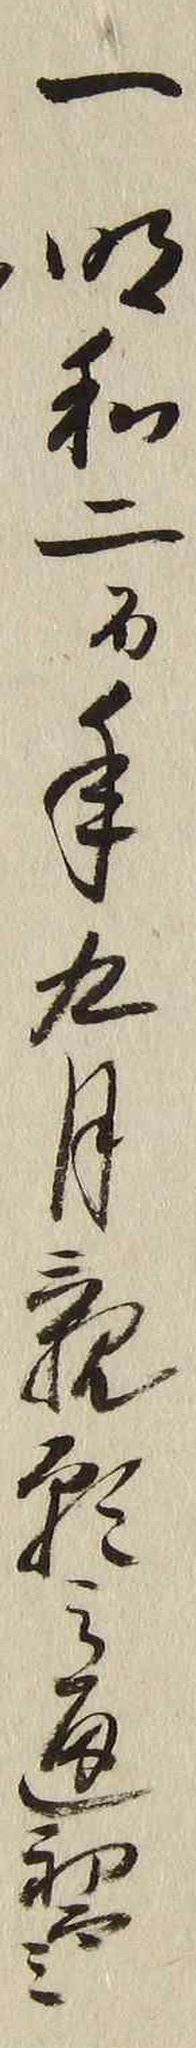一明和二酉年九月親願之通初而之
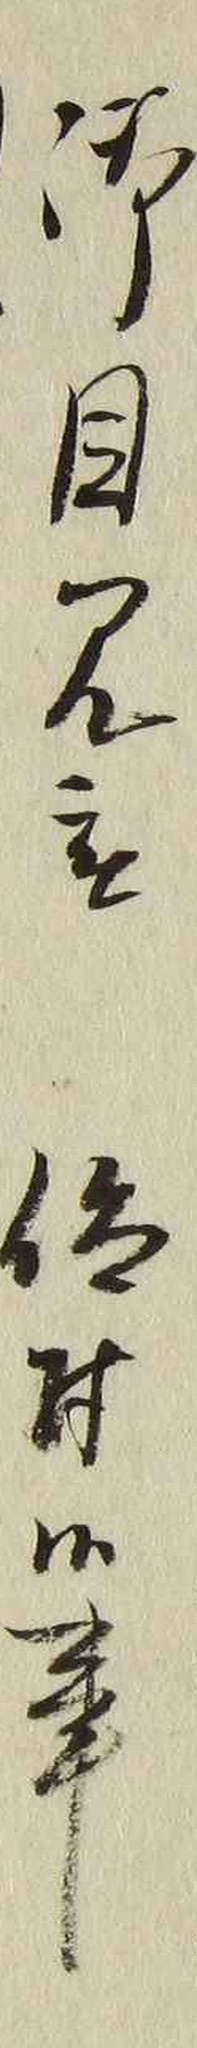御目見被仰付候事
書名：諸士系譜　巻之355　す之部5
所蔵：会津若松市立会津図書館
